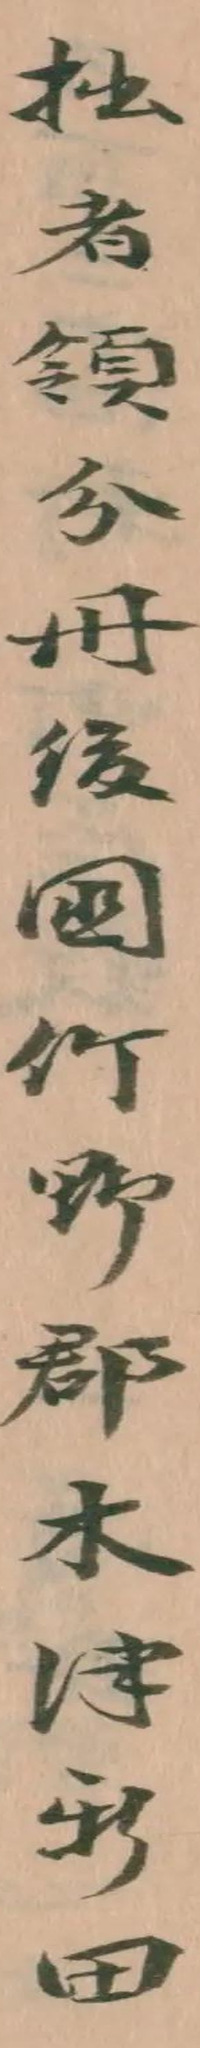拙者領分丹後国竹野郡木津新田
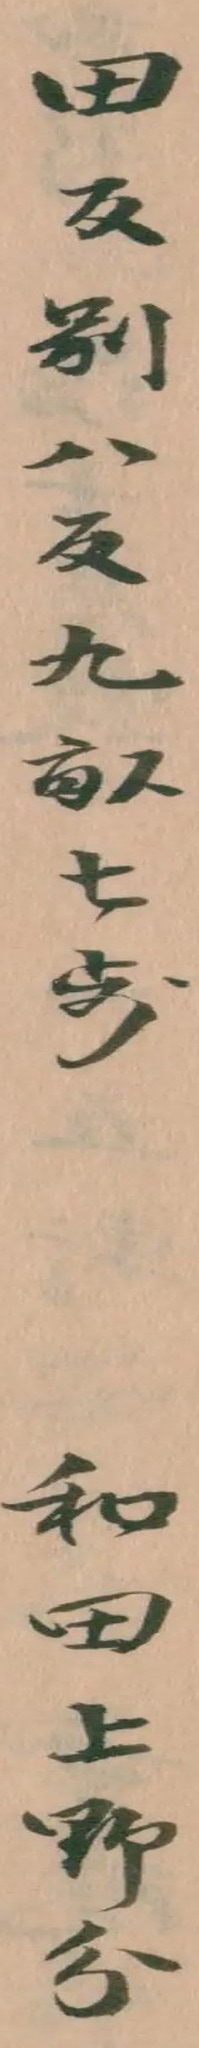田反別八反九畝七歩和田上野分
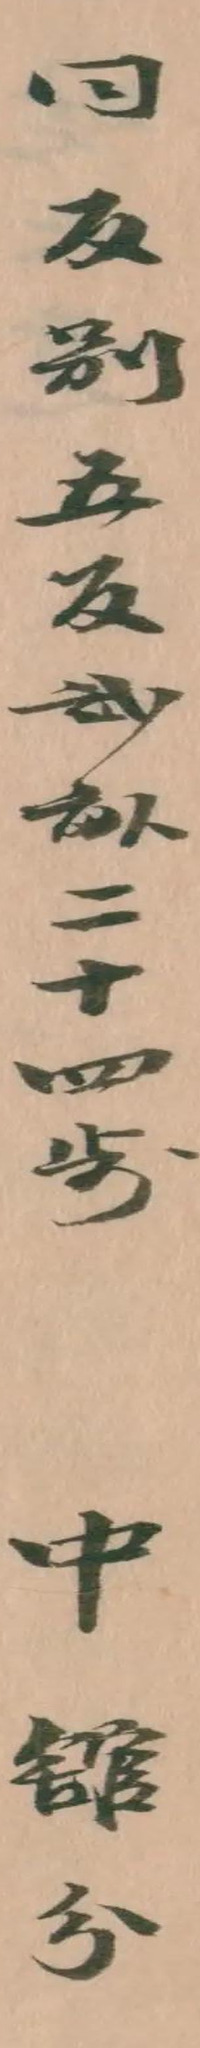田反別五反弐畝二十四歩中館分
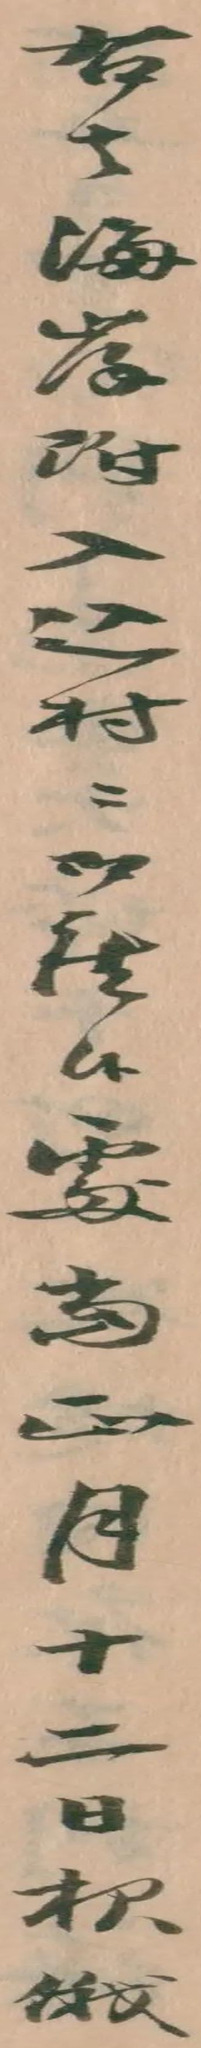右ハ海岸附入込村二御座候処当正月十二日夜俄
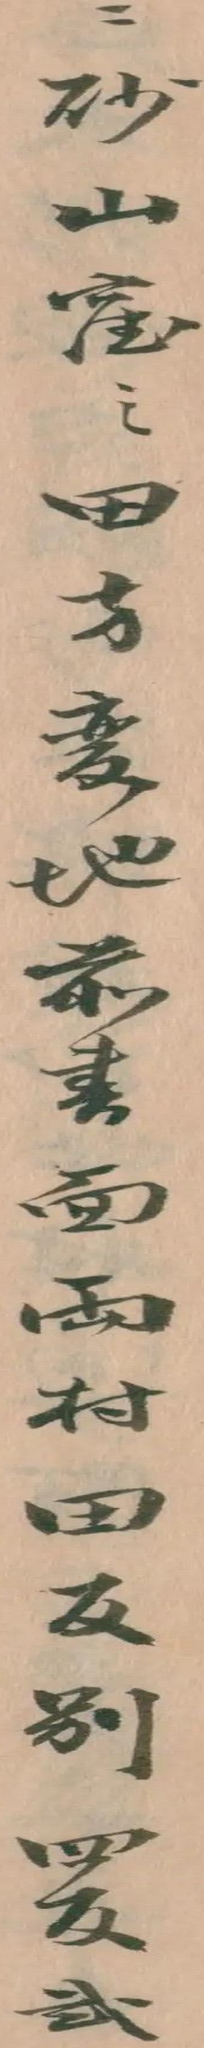二砂山窪ミ田方変地前書面両村田反割四反弐
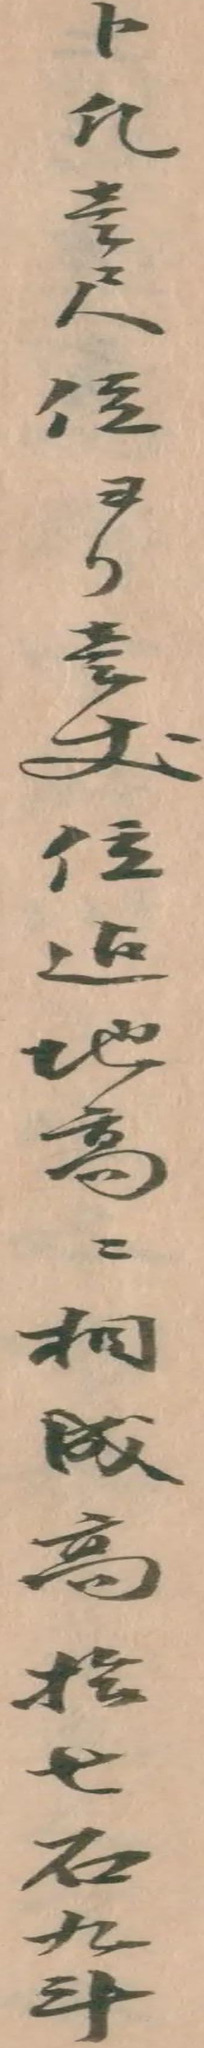分凡壱尺位より壱丈位迄地高二相成高拾七石九斗
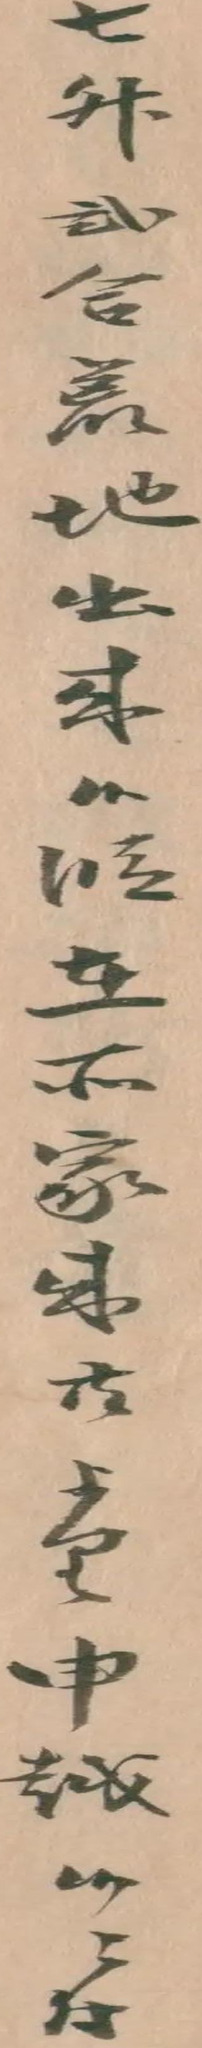七升弐合荒地出来候段在所家来共より申越候付
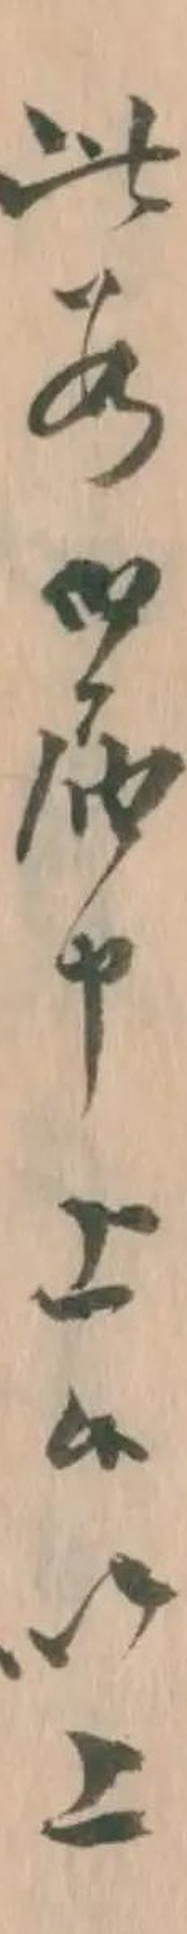此段御届申上候以上

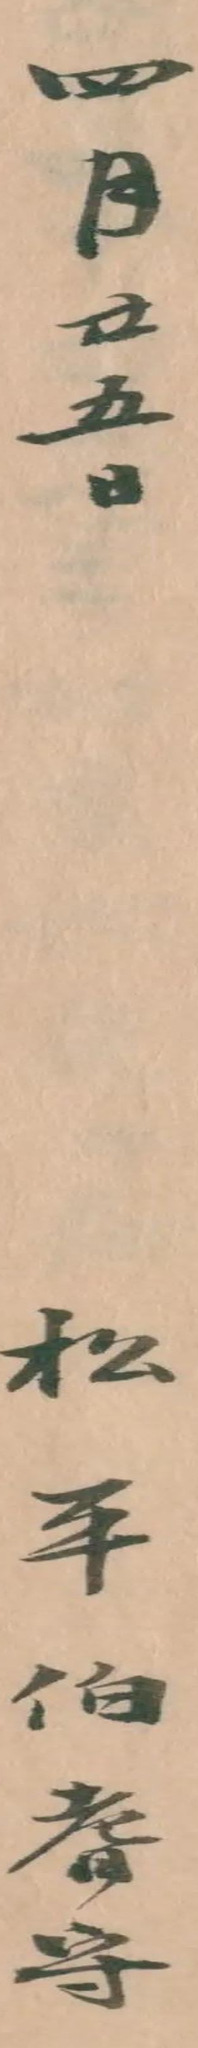四月廿五日松平伯耆守
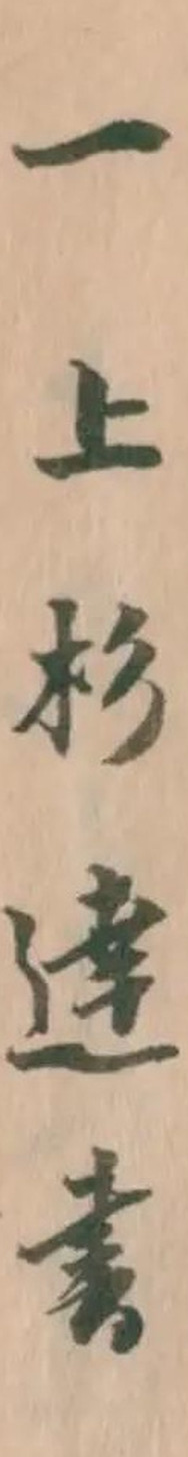一上杉達書
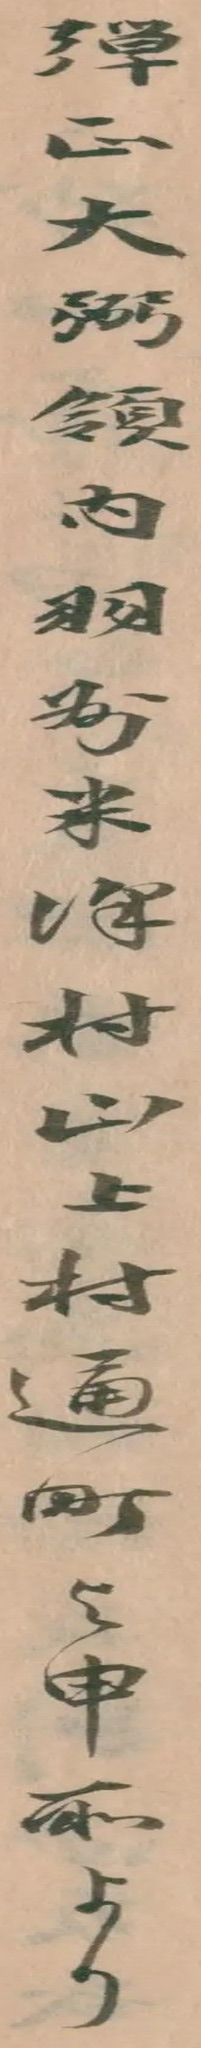弾正大弼領内羽州米沢村山上村通町と申所より
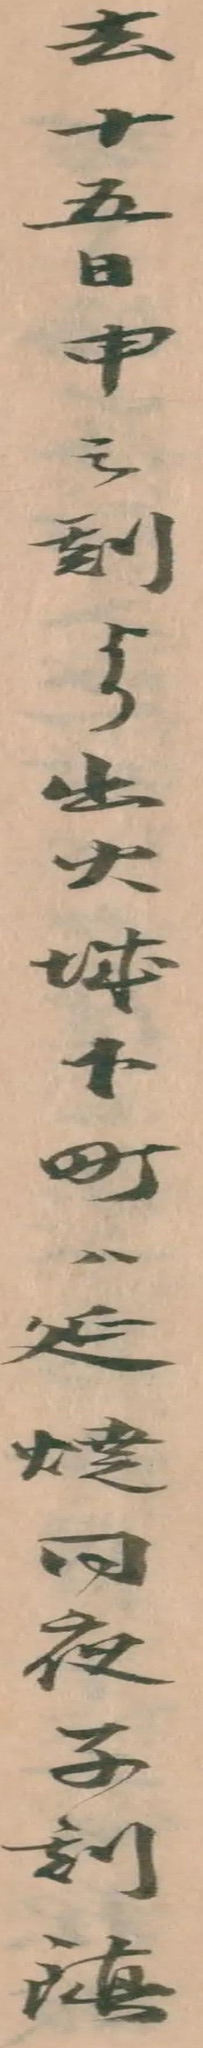去十五日申之刻より出火城下町ハ延焼同夜子刻鎮
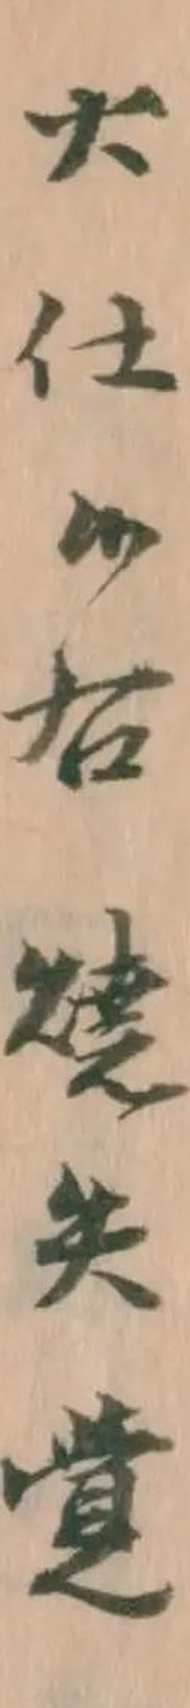火仕候右焼失之覚
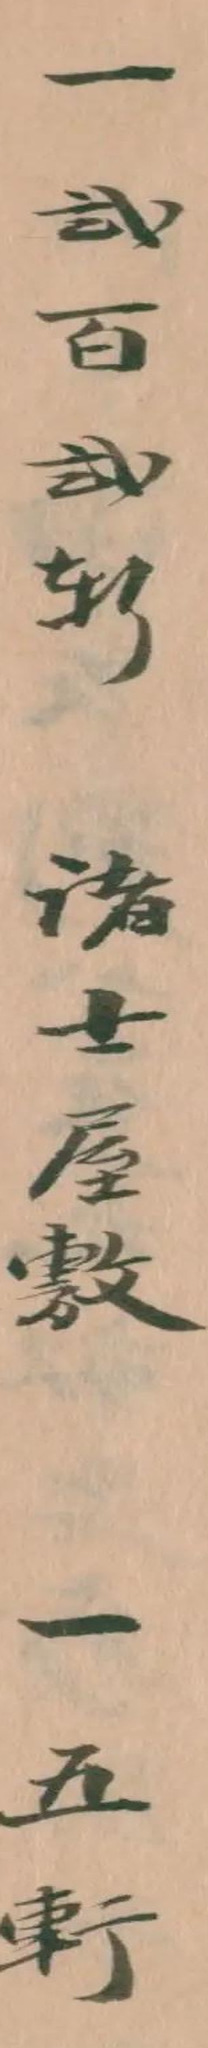一弐百弐軒諸士屋敷一五軒寺院
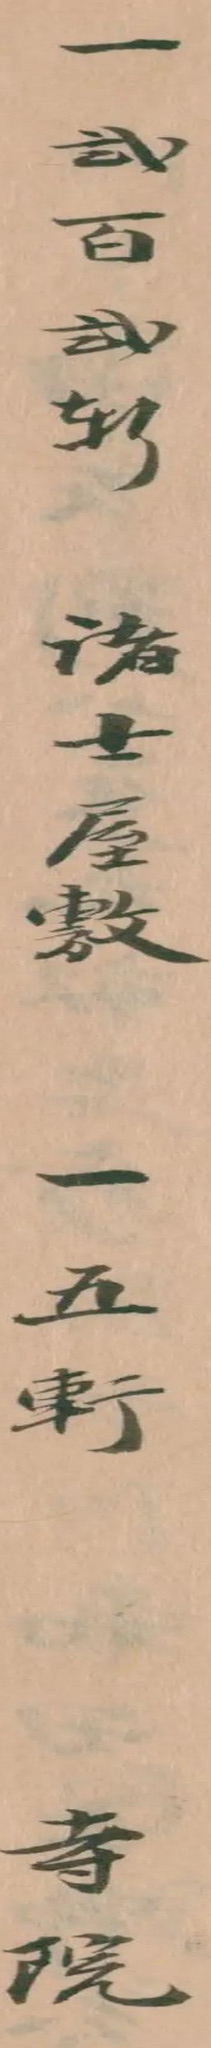一弐百弐軒諸士屋敷一五軒寺院
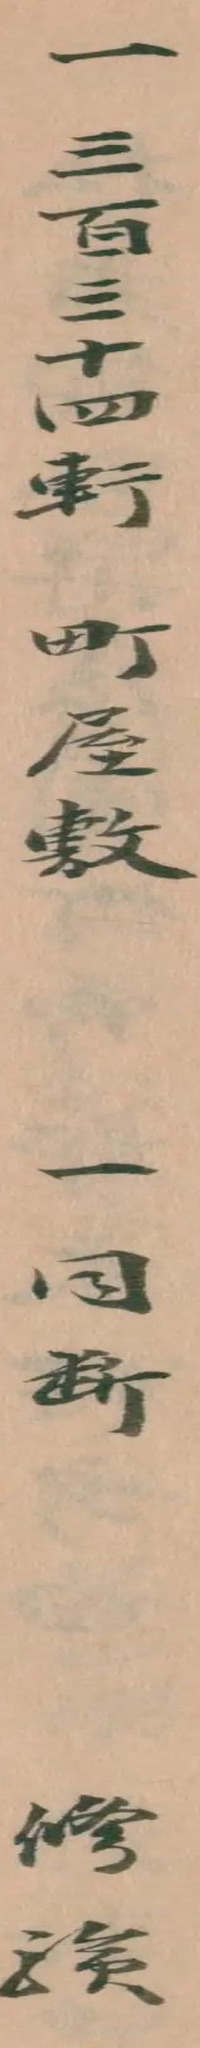一三百三十四軒町屋敷一同断修験
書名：地災撮要. 巻3(地震之部)-巻4(噴火之部)
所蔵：国立国会図書館 National Diet Library, JAPAN
